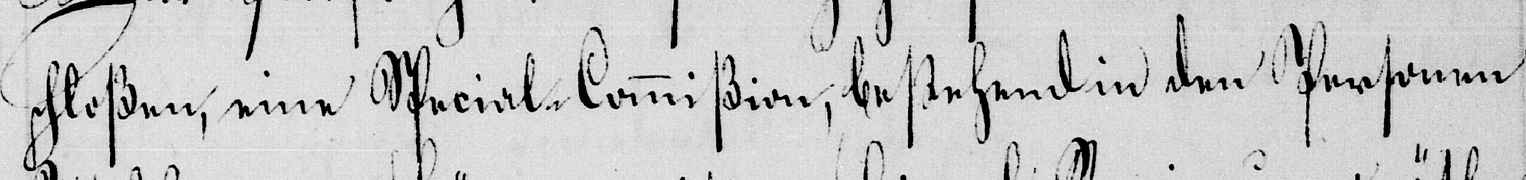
schloßen, eine Special-Commißion, bestehend in den Personen
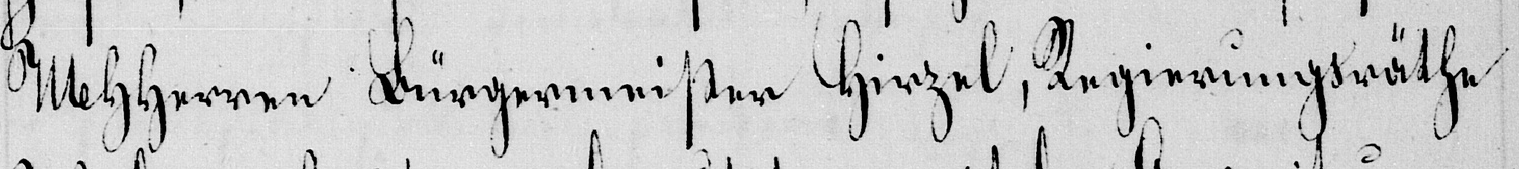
MHHerren Bürgermeister Hirzel, Regierungsräthe
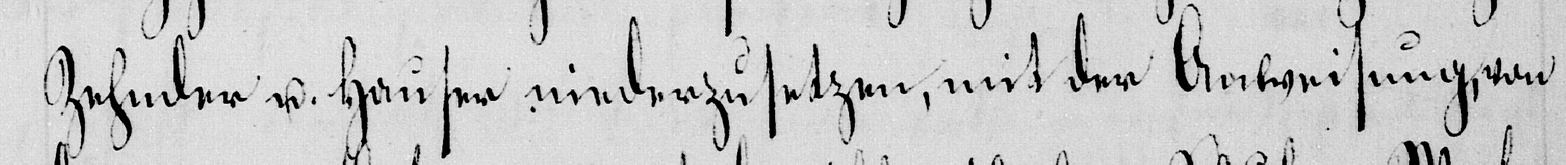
Zehnder u. Hauser niederzusetzen, mit der Anweisung, von
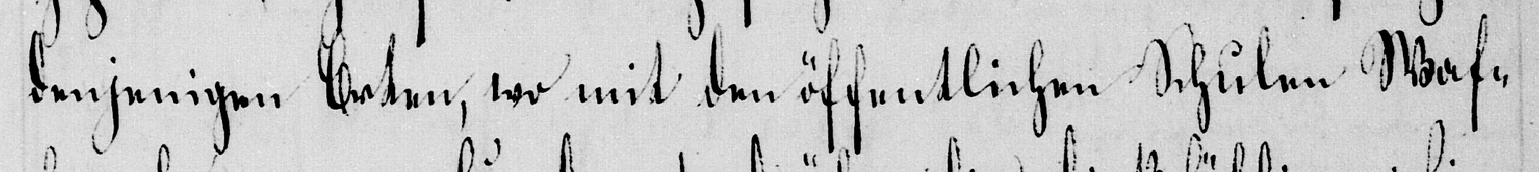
denjenigen Orten, wo mit den öffentlichen Schulen Waf¬
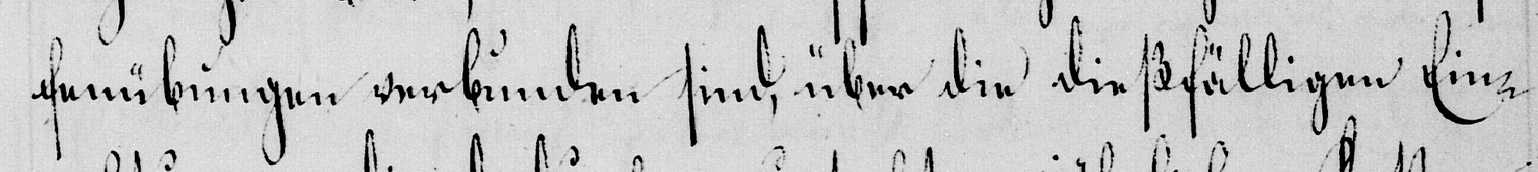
fenübungen verbunden sind, über die dießfälligen Ein¬
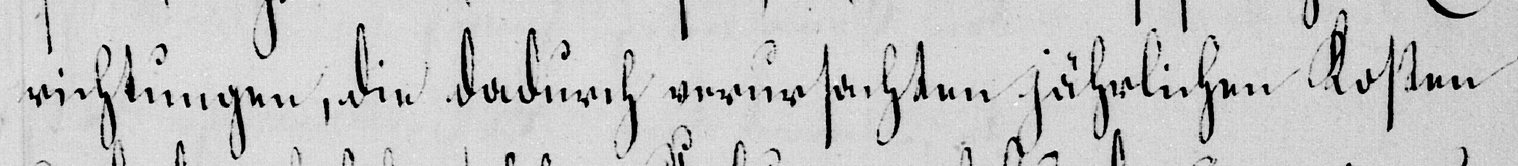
richtungen, die dadurch verursachten jährlichen Kosten
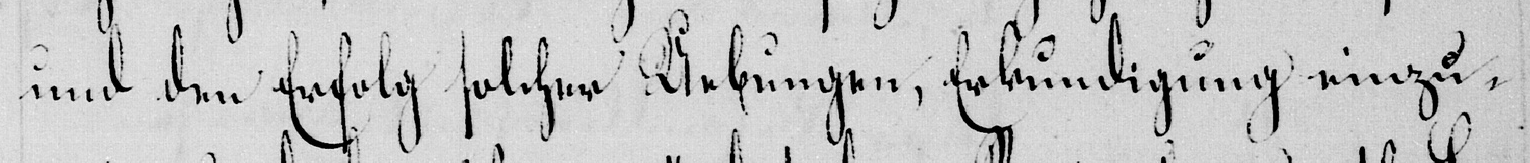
und den Erfolg solcher Uebungen, Erkundigung einzu¬
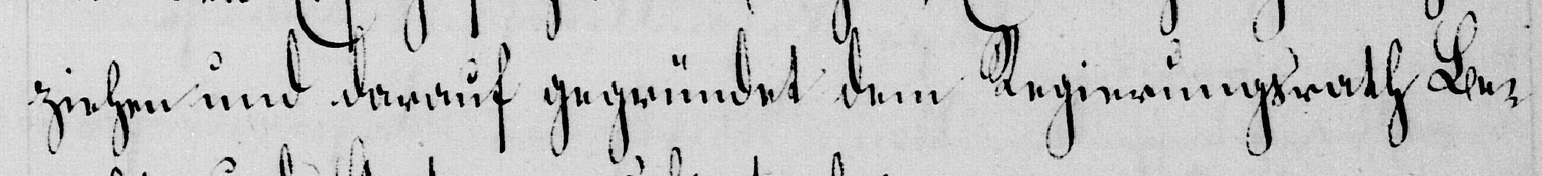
ziehen und darauf gegründet dem Regierungsrath Be¬
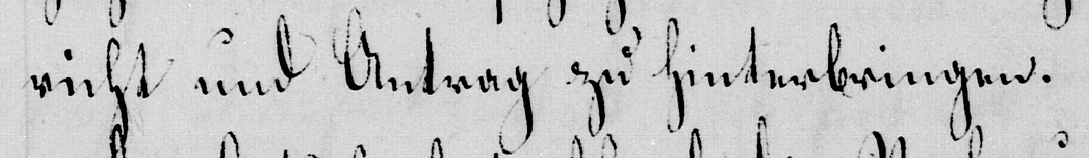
richt und Antrag zu hinterbringen.
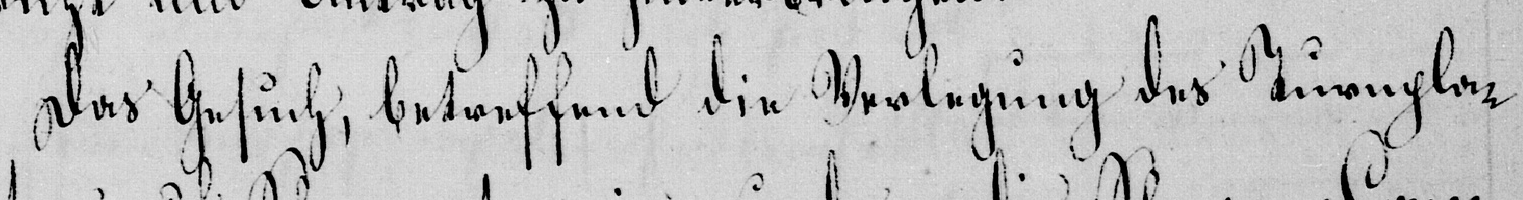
Das Gesuch, betreffend die Verlegung des Turnpla¬
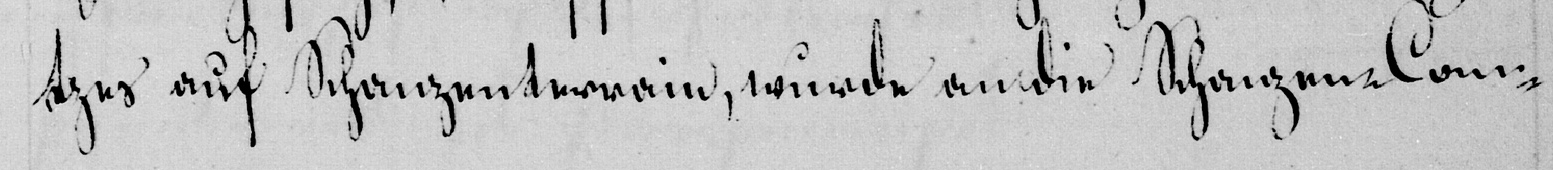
tzes auf Schanzenterrain, wurde an die Schanzen-Com-
